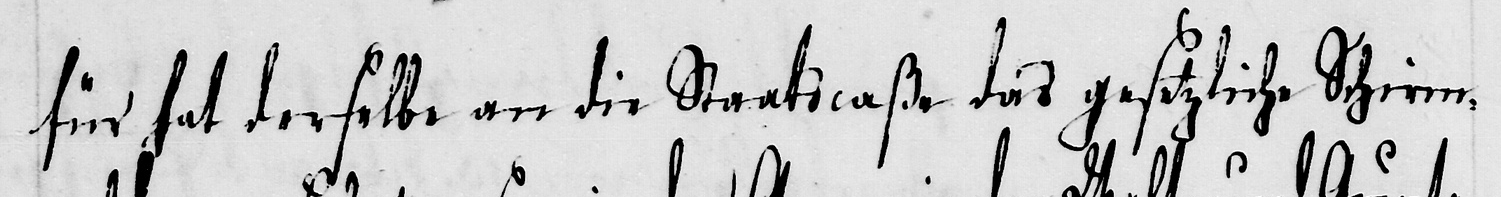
für hat derselbe an die Staatscaße das gesetzliche Schirm¬
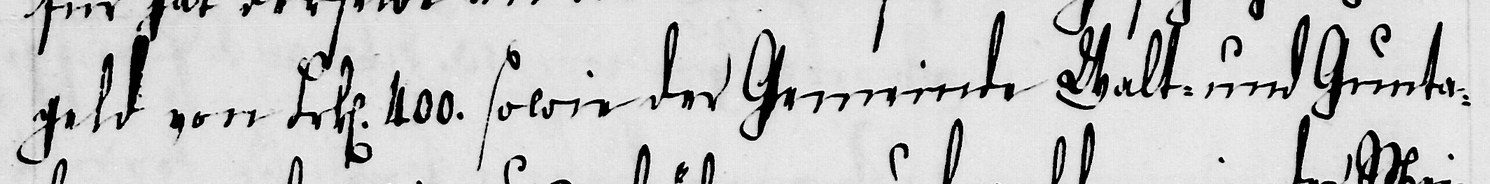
geld von Frk. 400. sowie der Gemeinde Walt- und Gunta¬
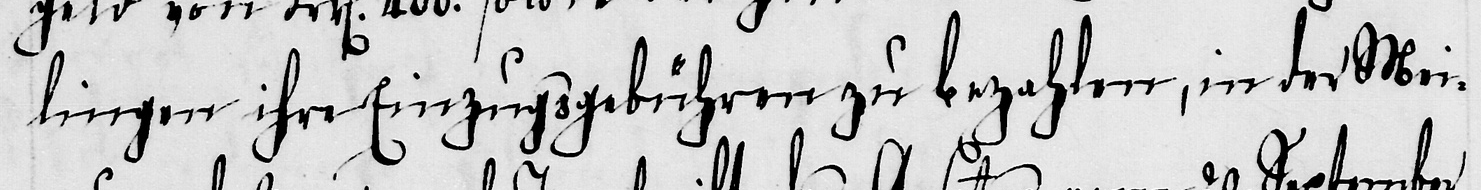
lingen ihre Einzugsgebühren zu bezahlen, in der Mei¬
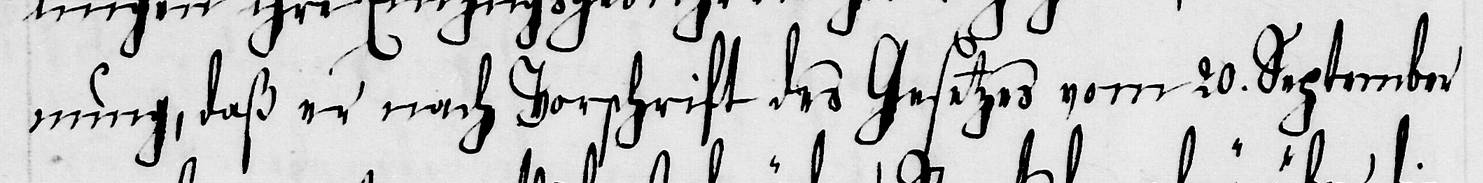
nung, daß er nach Vorschrift des Gesetzes vom 20. September
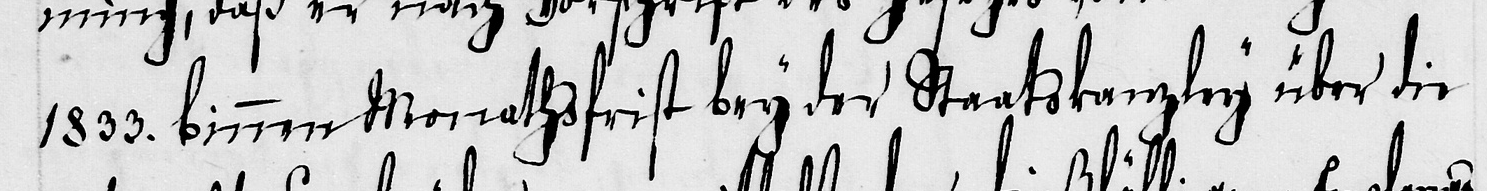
1833. binnen Monathsfrist bey der Staatskanzley über die
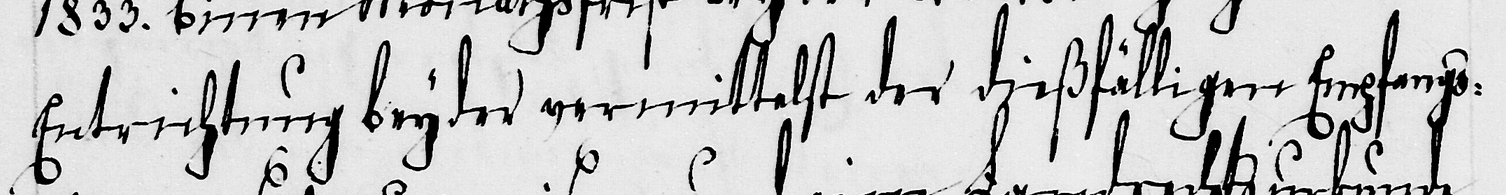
Entrichtung beyder vermittelst der diesßfälligen Empfang¬
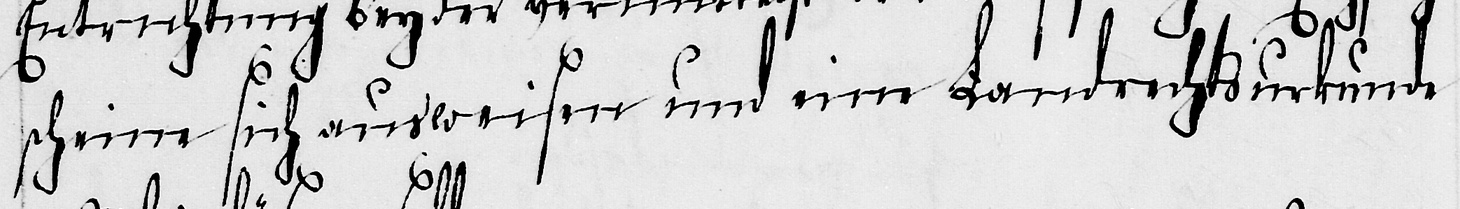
scheine sich ausweisen und eine Landrechtsurkunde
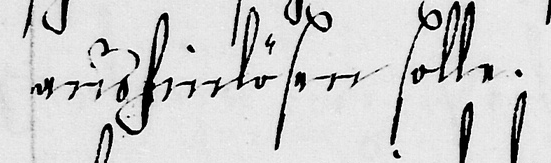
aushinlösen solle.
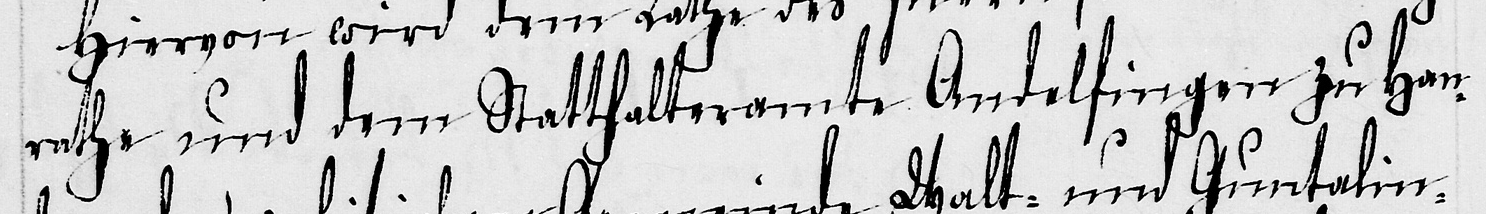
rathe und dem Statthalteramte Andelfingen zu Han¬
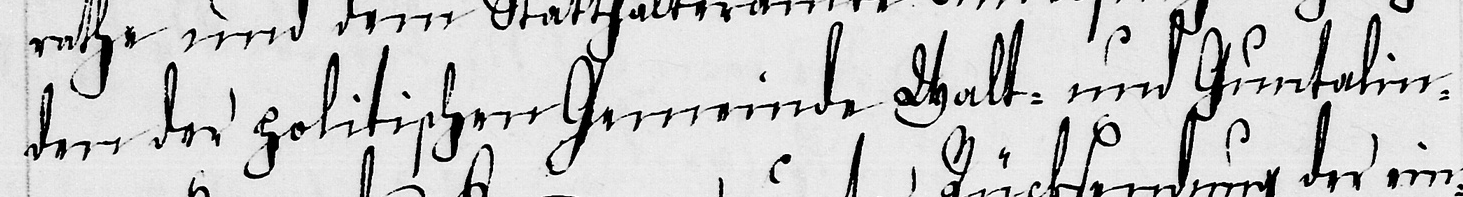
den der politischen Gemeinde Walt- und Guntalin¬
